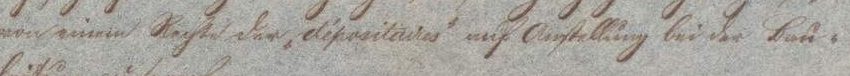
von einem Rechte der «dépositaires» auf Anstellung bei der Bau-
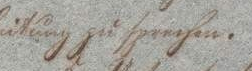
leitung zu sprechen.
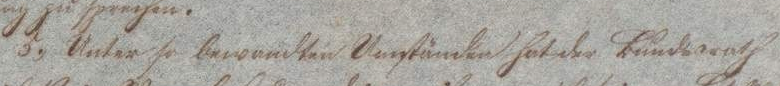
5. Unter so bewandten Umständen hat der Bundesrath
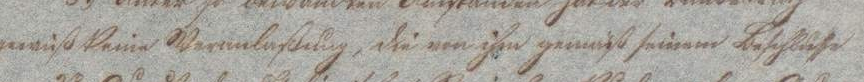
gewiß keine Veranlaßung, die von ihm gemäß seinem Beschlusse
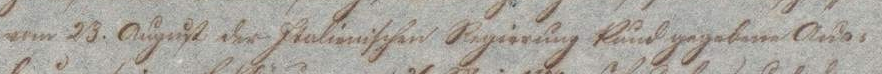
vom 23. August der Italienischen Regierung kund gegebene Aus-
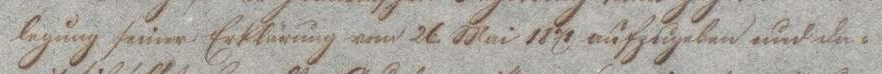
legung seiner Erklärung vom 26. Mai 1871 aufzugeben und da-
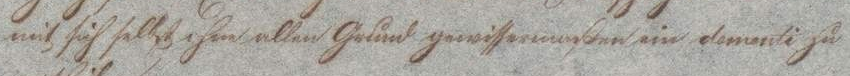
mit sich selbst ohne allen Grund gewissermaßen ein dementi zu
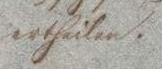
ertheilen.
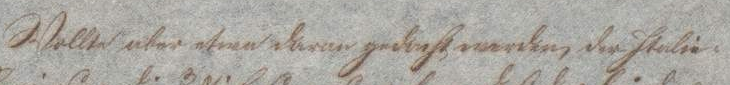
Wollte aber etwa daran gedacht werden, der Italie-
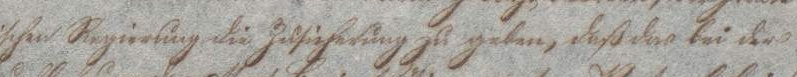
nischen Regierung die Zusicherung zu geben, daß das bei der
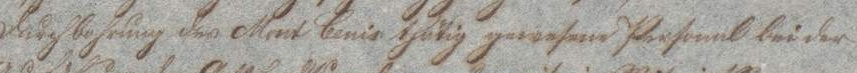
Durchbohrung des Mont Cenis thätig gewesene Personal bei der
